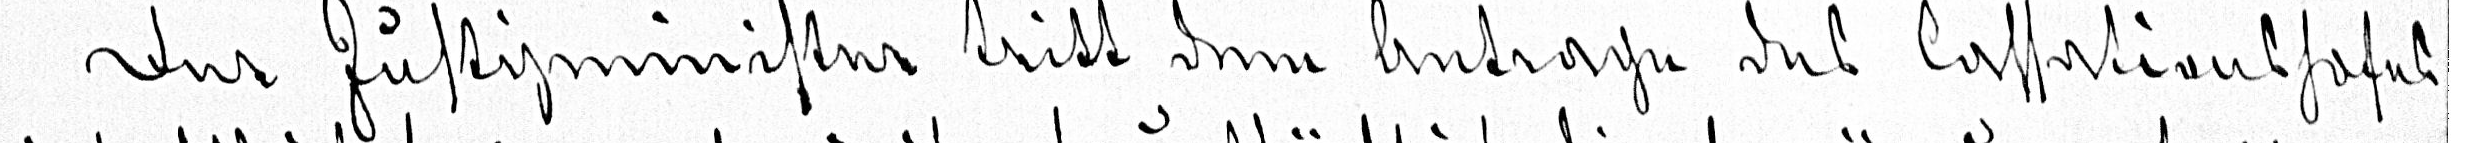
Der Justizminister tritt dem Antrage des Cassationshofes
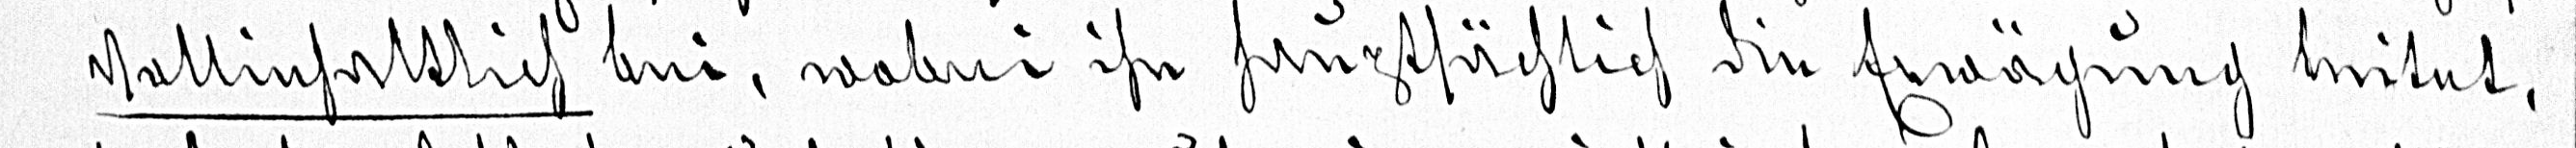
vollinhaltlich bei, wobei ihn hauptsächlich die Erwägung leitet,
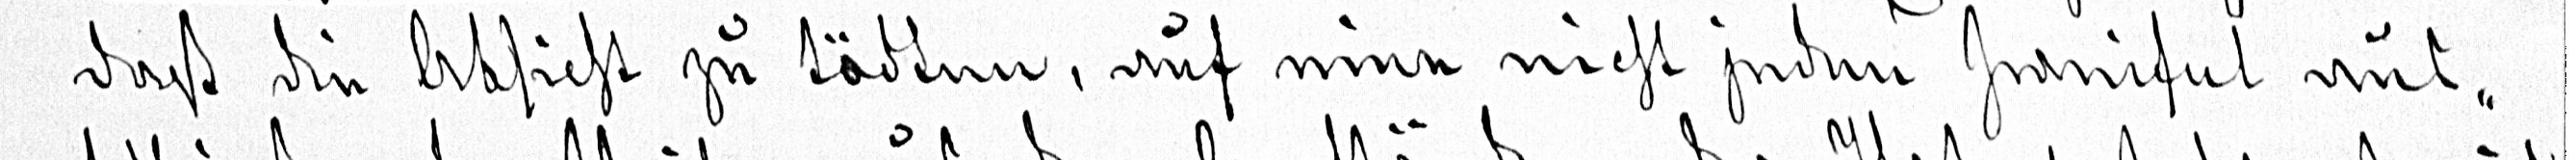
daß die Absicht zu tödten, auf eine nicht jeden Zwinfel aus¬
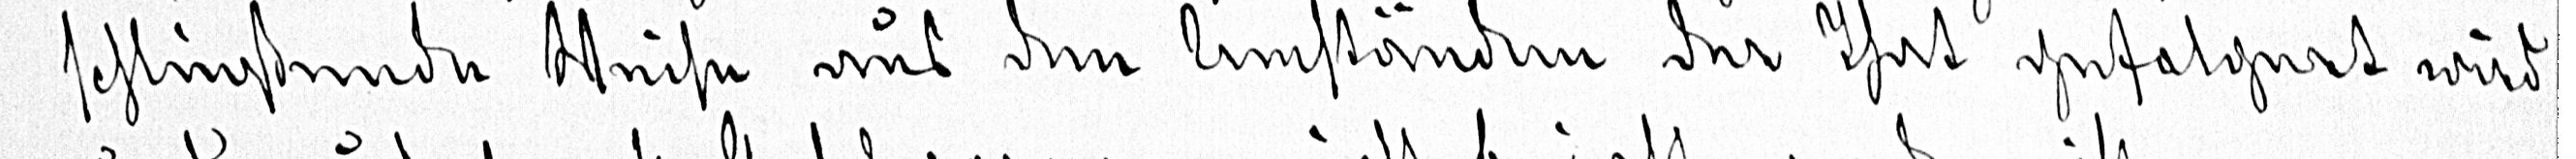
schließende Weise aus den Umständen der That gefolgert wird
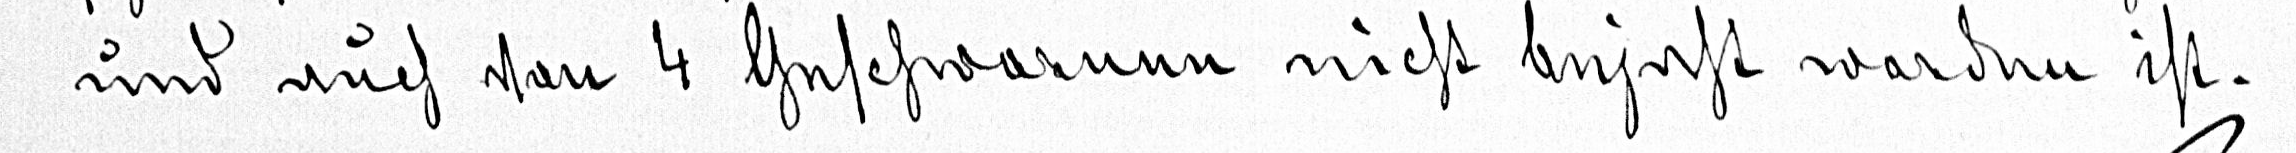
und auch von 4 Geschwornen nicht bejaht worden ist.
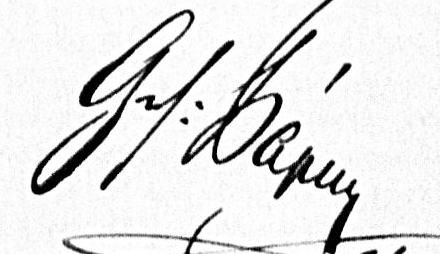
Ges: xx
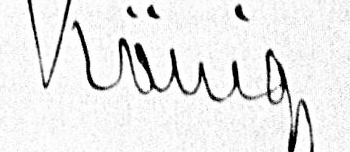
König
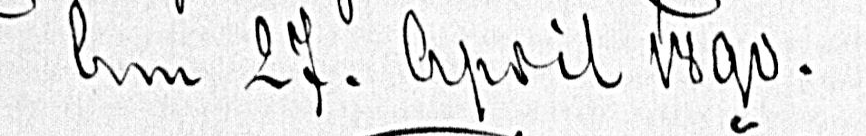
Am 27. April 1890.
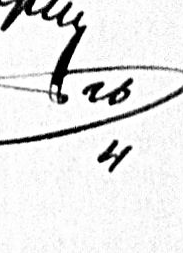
26/11
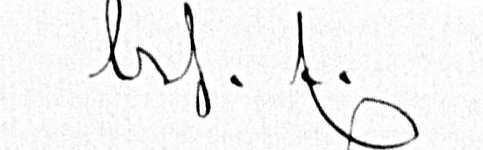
Ah. E.
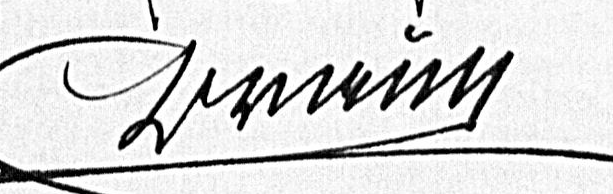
xx
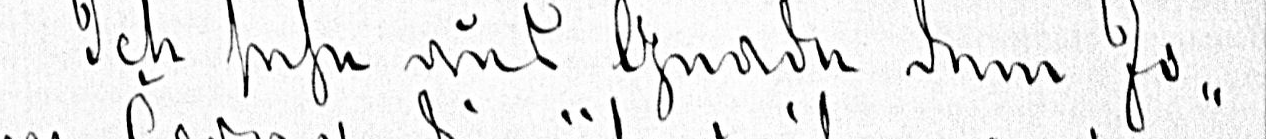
Ich sehe aus Gnade dem Jo¬
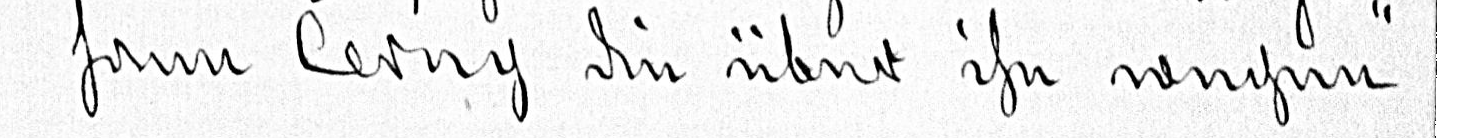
hann Černy die über ihr wegen
